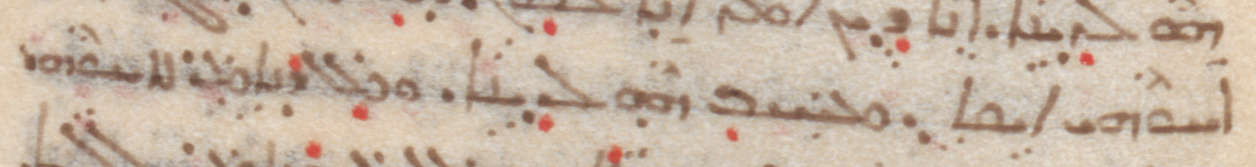ܐܚܘܗܝ ܐܝܩܐ܆ ܡܚܝܒ ܗ̣ܘ ܠܕܝܢܐ. ܘܟܠ ܕܢܐܡܪ ܠܐܚܘܗܝ
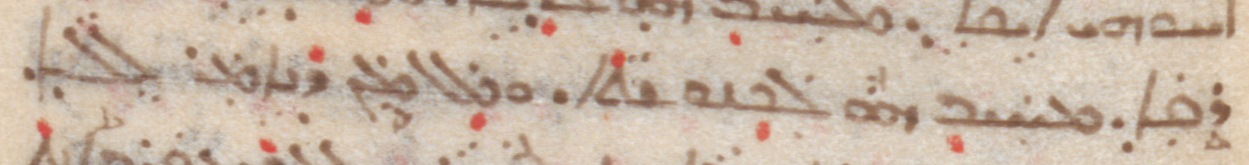ܪܩܐ. ܡܚܝܒ ܗܘ ܠܟܢܘܫܬܐ ܘܡ̇ܢ ܕܢܐܡܪ ܠܠܐ
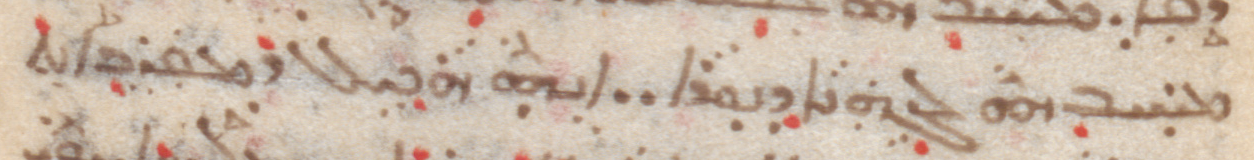ܡܚܝܒ ܗܘ ܠܓܗܢܐ ܕܢܘܪܐ.. ܐܢܗܘ ܗܟܝܠ ܕܡܩܪܒ ܐܢܬ
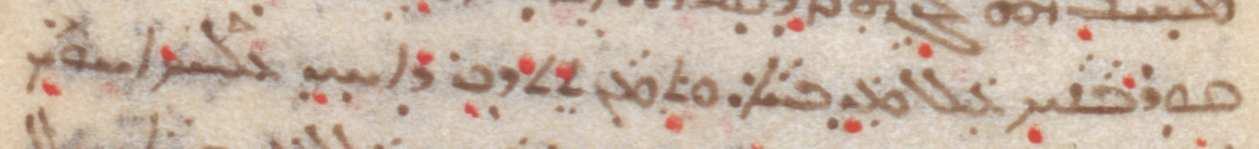ܩܘܪܒܢܟ ܥܠ ܡܕܒܚܐ܇ ܘܬܡܢ ܬܬܕܟܪ ܕܐܚܝܕ ܥܠܝܟ ܐܚܘܟ
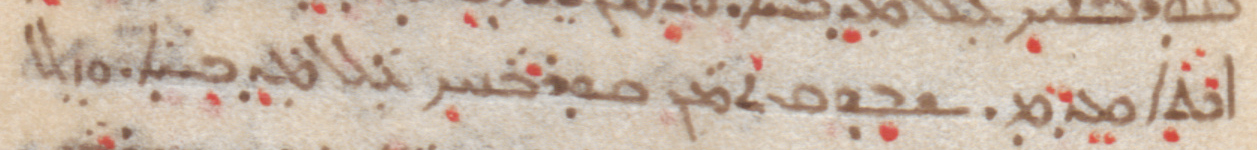ܐܟܬܐ ܡܕܡ. ܫܒܘܩ ܬܡܢ ܩܘܪܒܢܟ ܥܠ ܡܕܒܚܐ. ܘܙܠ
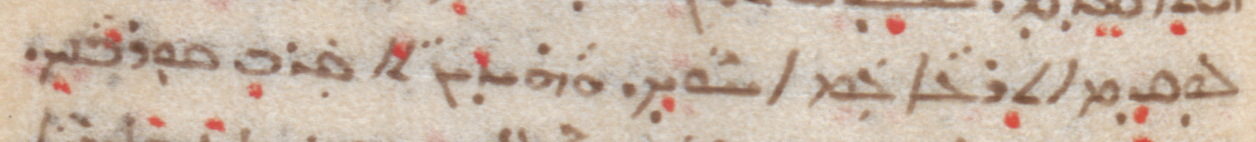ܠܘܩܕܡ ܐܬܪܥܐ ܥܡ ܐܚܘܟ܆ ܘܗܝܕܝܢ ܬܐ ܩܪܒ ܩܘܪܒܢܟ.
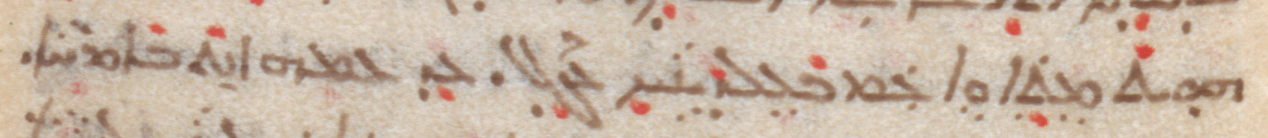ܗܘܝܬ ܡܬܐܘܐ ܥܡ ܒܥܠܕܝܢܟ ܥܓܠ. ܥܕ ܥܡܗ ܐܢܬ ܒܐܘܪܚܐ.
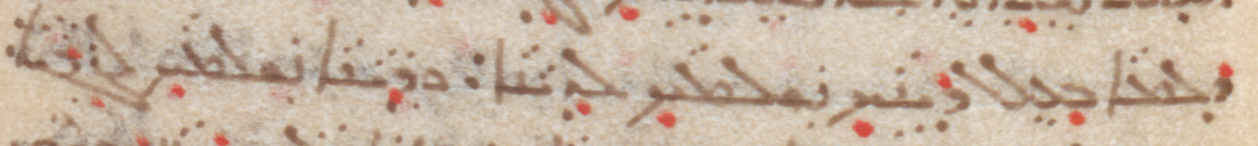ܕܠܡܐ ܒܥܠ ܕܝܢܟ ܢܫܠܡܟ ܠܕܝܢܐ: ܘܕܝܢܐ ܢܫܠܡܟ ܠܓܒܝܐ:
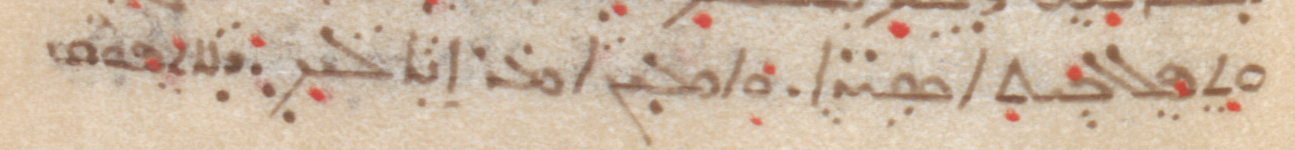ܘܬܦܠ ܒܝܬ ܐܣܝܪ̈ܐ. ܘܐܡܝܢ ܐܡ̇ܪ ܐܢܐ ܠܟ܆ ܕܠܐ ܬܦܘܩ
